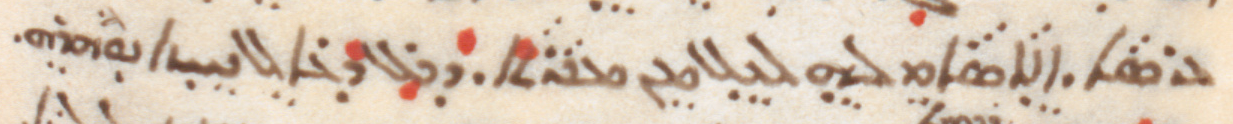ܥܪܣܐ. ܐܠ̣ܐ ܣ̇ܐܡ ܠܗ ܠܟܠ ܡ̣ܢ ܡܢܪܬܐ. ܕܟܠ ܕܥ̇ܐܠ ܢܚܙܐ ܢܘܗܪܗ.
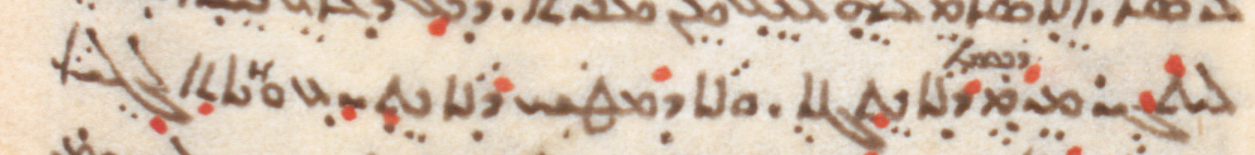ܠܝܬܓܝܪ ܡܕܡ ܕܟܣܐ ܕܠܐ ܢܬܓܠܐ. ܘܠܐ ܕܡܛܫܝ ܕܠܐ ܢܬܝܕܥ ܘܢܐܬܐ ܠܓܠܝܐ
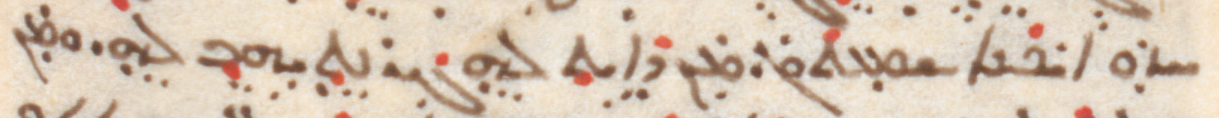ܚܙܘ ܐܝܟܢܐ ܫܡܥܬܘܢ. ܡ̇ܢ ܕܐܝܬ ܠܗ ܓܝܪ ܢܬܝܗܒ ܠܗ. ܘܡ̇ܢ
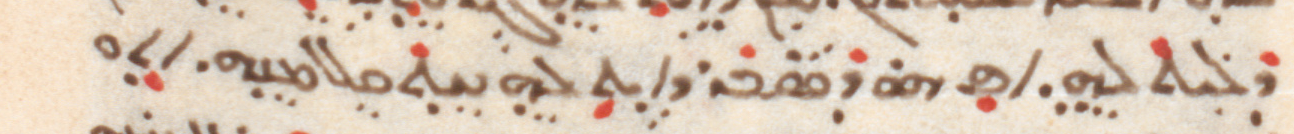ܕܠܝܬ ܠܗ. ܐܦ ܗ̇ܘ ܕܣ̇ܒܪ ܕܐܝ̣ܬ ܠܗ ܢܫܬ̣ܩܠ ܡܢܗ.ܐܬ̣ܘ
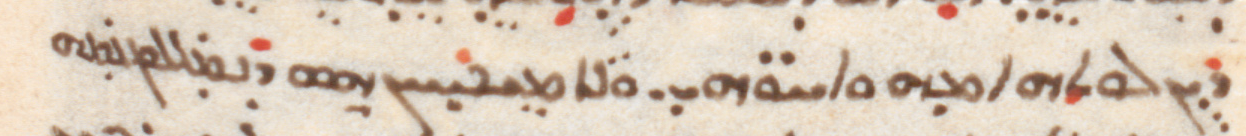ܕܝܢ ܠܘܬܗ ܐܡ̣ܗ ܘܐܚܘ̈ܗܝ܆ ܘܠܐ ܡܫܟܚ̣ܝܢ ܗܘܘ ܕܢܡܠܠܘܢ ܥܡܗ
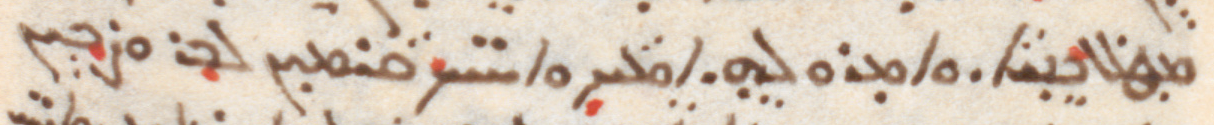ܡܛܠ ܟܢܫܐ. ܘܐܡ̣ܪܘ ܠܗ. ܐܡܟ ܘܐܚ̈ܝܟ ܩܝ̇ܡܝܢ ܠܒܪ ܘܨ̇ܒܝܢ
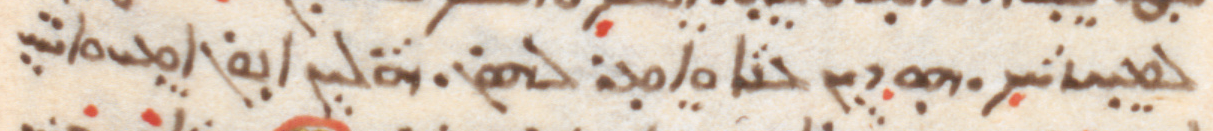ܠܡܚ̣ܙܝܟ. ܗ̣ܘ ܕܝܢ ܥܢܐ ܘܐܡ̣ܪ ܠܗܘܢ. ܗ̇ܠܝܢ ܐܢܘܢ ܐܡܝ ܘܐܚ̈ܝ
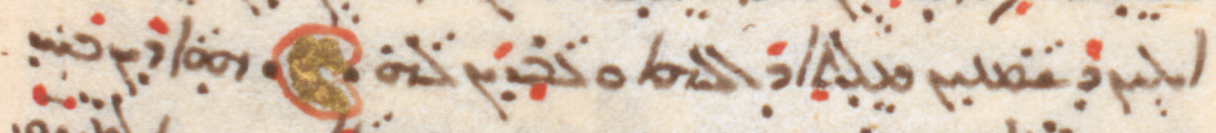ܐܝܠܝܢ ܕܫ̇ܡܥܝܢ ܡܠܬܐ ܕܐܠܗܐ ܘܥ̇ܒܕܝܢ ܠܗ̇܀܀ ܗ̣ܘܐ ܕܝܢ ܒܚܕ
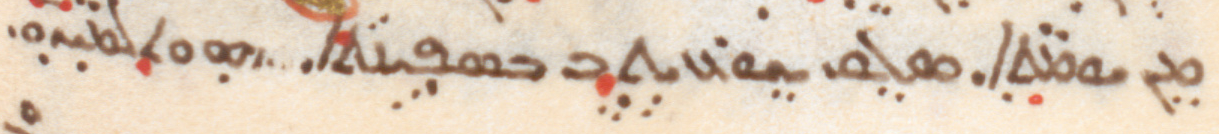ܡ̣ܢ ܝܘܡ̈ܬܐ܆ ܣܠ̣ܩ ܝܫܘܥ ܝܬ̣ܒ ܒܣܦܝܢܬܐ. ܗ̣ܘ ܘܬܠܡ̈ܝܕ܏ܘ.
